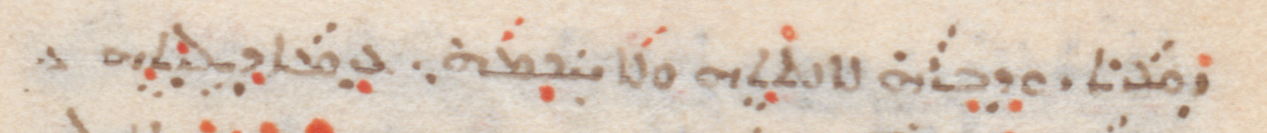ܕܡܪܝܐ.ܘܕܒܪܗ̇ ܠܐܢܬܬܗ ܘܠܐ ܚܟܡܗ̇܆ ܥܕܡܐ ܕܝܠܕܬܗ
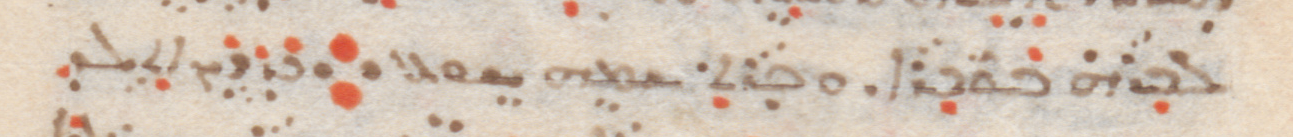ܠܒܪܗ̇ ܒܘܟܪܐ. ܘܩܪܬ݀ ܫܡܗ ܝܫܘܥ܀ ܟܕ ܕܝܢ ܐܬܝܠܕ
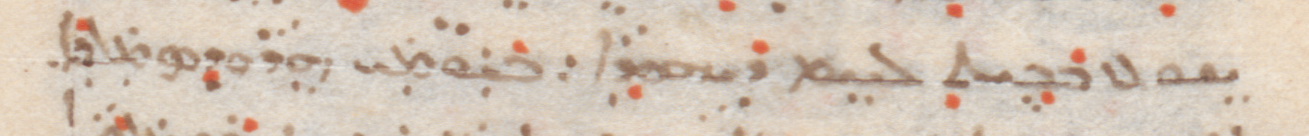ܝܫܘܥ ܒܒܝܬ݂ܠܚܡ ܕܝܗܘܕܐ܇ ܒܝܘܡ̈ܝ ܗܪܘܕܣ ܡܠܟܐ.
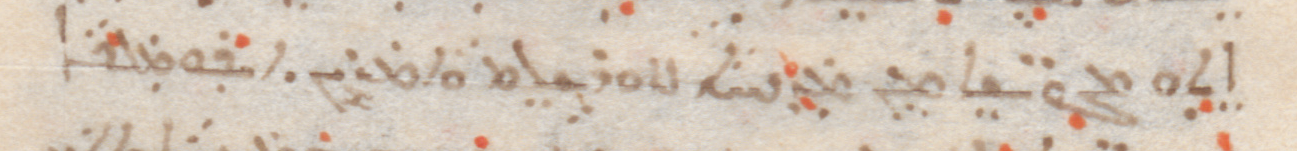ܐܬ̣ܘ ܡܓܘ̈ܫܐ ܡ̣ܢ ܡܕܢܚܐ ܠܐܘܪܫܠܡ. ܘܐܡܪܝܢ. ܐܝܟܘ ܡܠܟܐ
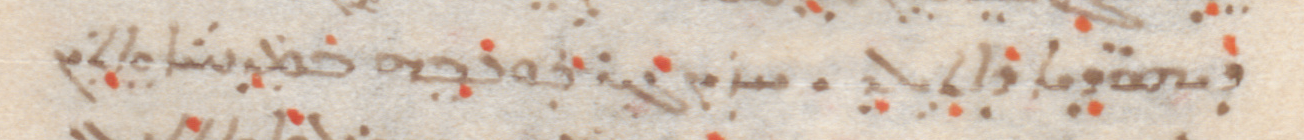ܕܝܗܘܕܝܐ ܕܐܬܝܠܕ. ܚܙܝܢ ܓܝܪ ܟܘܟܒܗ ܒܡܕܢܚܐ ܘܐܬܝܢ
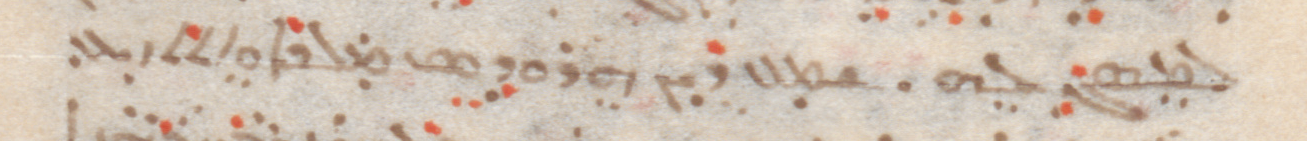ܠܡܣܓܕ ܠܗ. ܫܡ̣ܥ ܕܝܢ ܗܪܘܕܣ ܡܠܟܐ ܘܐܬܬܙܝܥ.
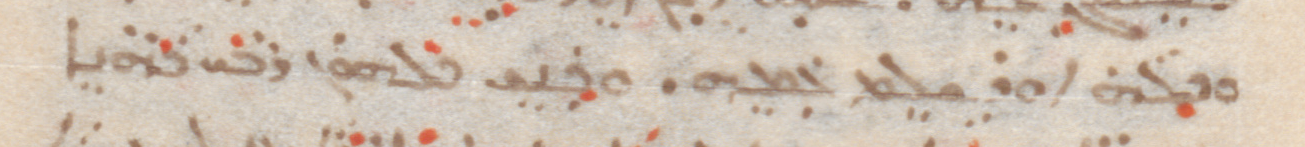ܘܟܠܗ̇ ܐܘܪܫܠܡ ܥܡܗ. ܘܟܢܫ ܟܠܗܘܢ ܪ̈ܒܝ ܟܗ̈ܢܐ
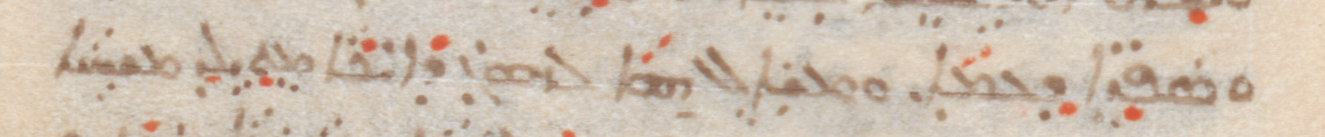ܘܣܦܪ̈ܐ ܕܥܡܐ. ܘܡܫܐܠ ܗܘܐ ܠܗܘܢ ܕܐܝܟܐ ܡܬܝܠܕ ܡܫܝܚܐ
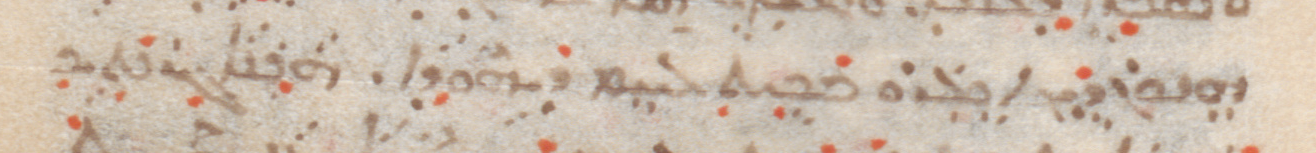ܗܢܘܢ ܕܝܢ ܐܡܪܘ ܒܒܝܬܠܚܡ ܕܝܗܘܕܐ. ܗܟܢܐ ܓܝܪ ܟܬܝܒ
